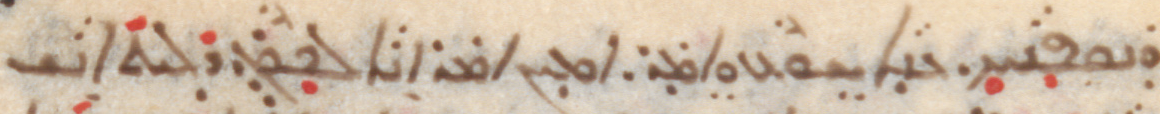ܘܢܩܦܢܟ. ܥܢ̣ܐ ܝܫܘܥ ܘܐܡ̣ܪ. ܐܡܝܢ ܐܡ̇ܪ ܐܢܐ ܠܟܘܢ܆ ܕܠܝܬ ܐܢܫ
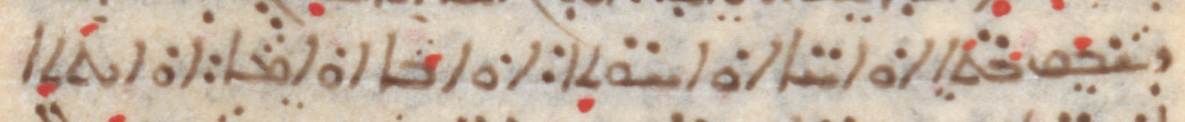ܕܫܒܩ ܒ̈ܬܐ ܐܘ ܐܚ̈ܐ ܐܘ ܐܚ̈ܘܬܐ: ܐܘ ܐܒܐ ܐܘ ܐܡܐ: ܐܘ ܐܢܬܬܐ
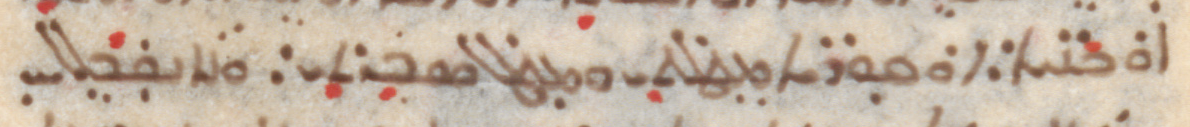ܐܘ ܒܢ̈ܝܐ: ܐܘ ܩܘܪ̈ܝܐ ܡܛܠܬܝ ܘܡܛܠ ܣܒܪܬܝ: ܘܠܐ ܢܩܒܠ ܚܕ
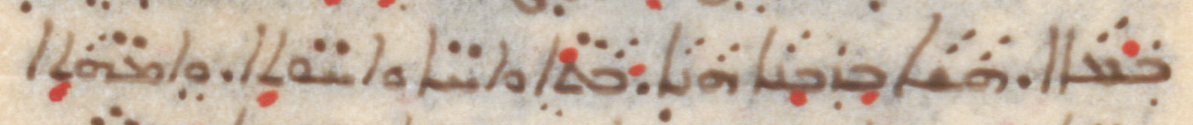ܒܡܐܐ. ܗܫܐ ܒܙܒܢܐ ܗܢܐ܆ ܒܬ̈ܐ ܘܐܚ̈ܐ ܘܐܚ̈ܘܬܐ. ܘܐܡ̈ܗܬܐ
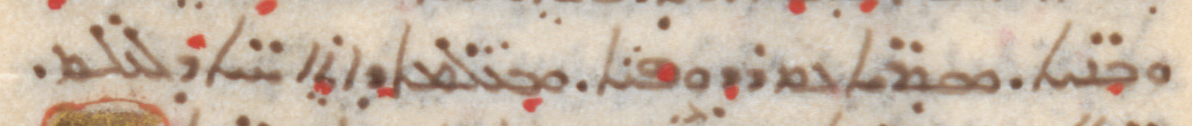ܘܒ̈ܢܝܐ. ܘܩܘܪ̈ܝܐ ܥܡ ܪܕܘܦܝܐ. ܘܒܥܠܡܐ ܕܐܬ̇ܐ ܚ̈ܝܐ ܕܠܥܠܡ.
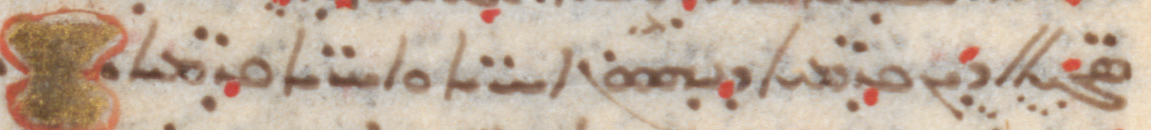ܣ̈ܓܝܐܐ ܕܝܢ ܩܕܡ̈ܝܐ ܕܢܗܘܘܢ ܐܚܪ̈ܝܐ ܘܐܚܪ̈ܝܐ ܩܕ̈ܡܝܐ ܀
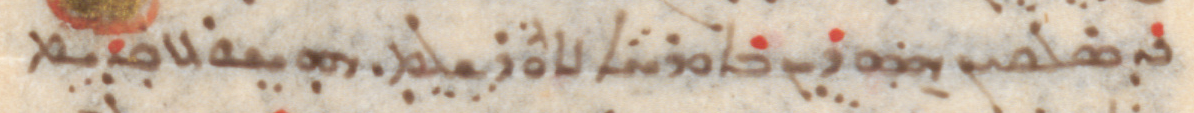ܟܕ ܣ̇ܠܩܝܢ ܗܘܘ ܕܝܢ ܒܐܘܪܚܐ ܠܐܘܪܫܠܡ܆ ܗ̣ܘ ܝܫܘܥ ܩܕܝܡ
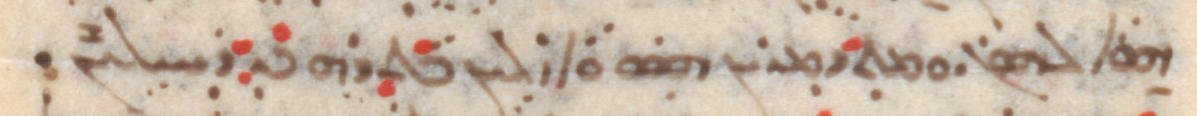ܗܘܐ ܠܗܘܢ. ܘܡܬܕܡܪܝܢ ܗܘܘ ܘܐܙ̇ܠܝܢ ܒܬܪܗ ܟܕ ܕܚܝܠܝܢ܉
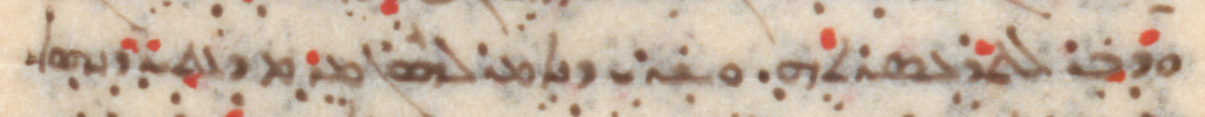ܘܕܒܪ ܠܬܪܥܣܪܬܗ܆ ܘܫܪܝ ܕܢ̣ܐܡܪ ܠܗܘܢ ܡܕܡ ܕܥܬܝܕ ܕܢܗܘܐ.
